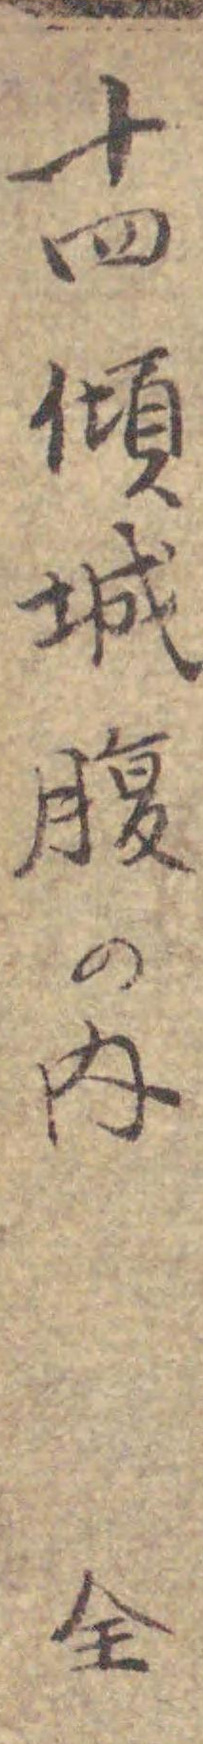十四傾城腹の内全

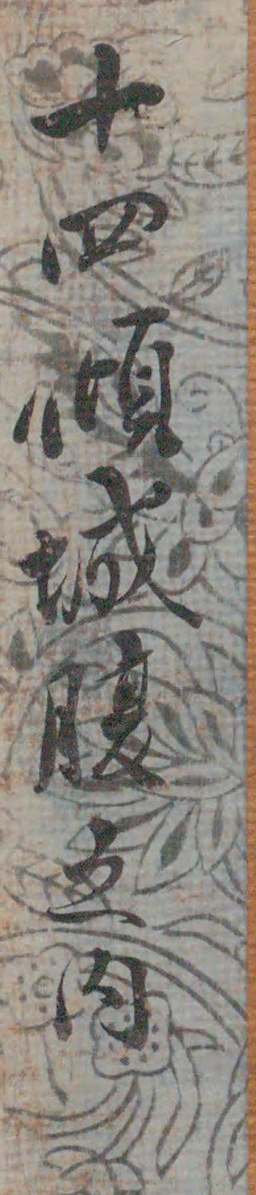十四傾城腹之内全

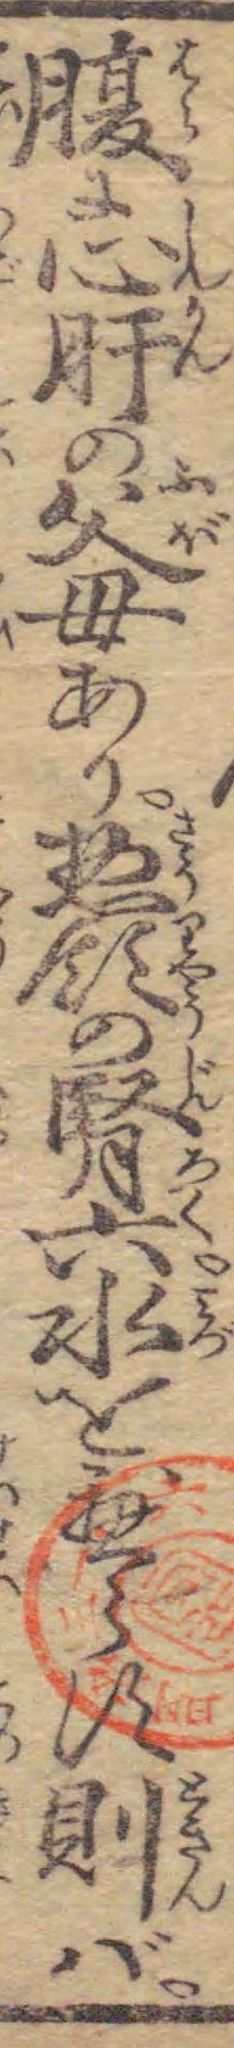腹に心肝の父母あり。惣領の腎六。水をへらす則ば。
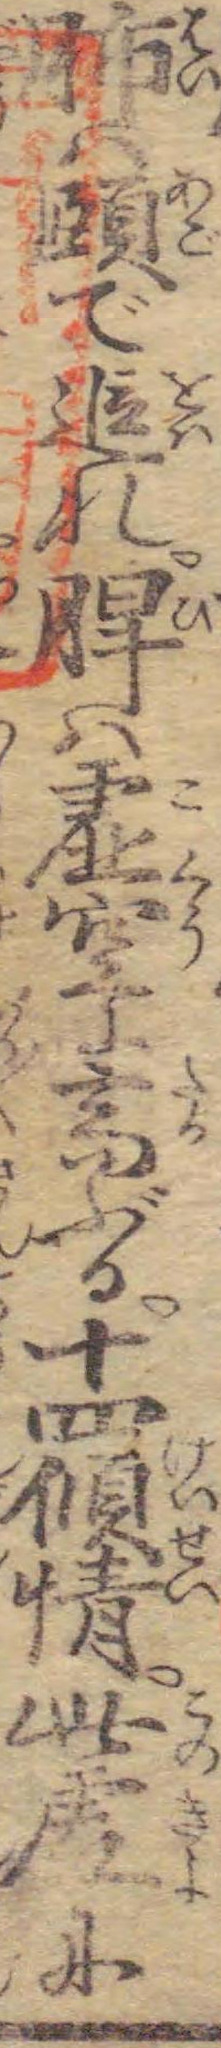肺は頤で追れ。脾は虚空に高ぶる。十四傾情。此虚に
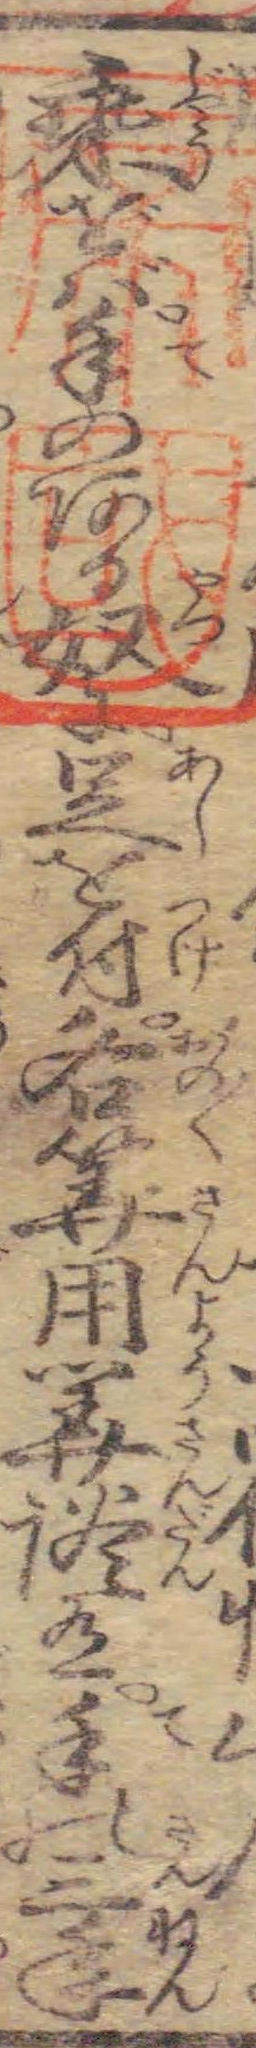乗ぜば。手のある奴に。足を付。各算用算談有。手の三年
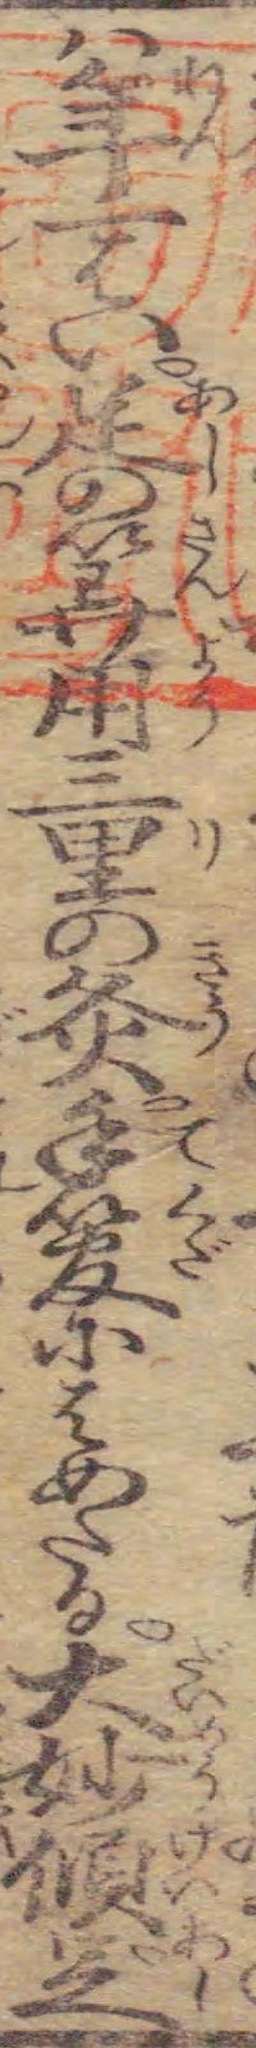は年一はい。足の算用三里の灸。手管にはめたる。大妙傾。足
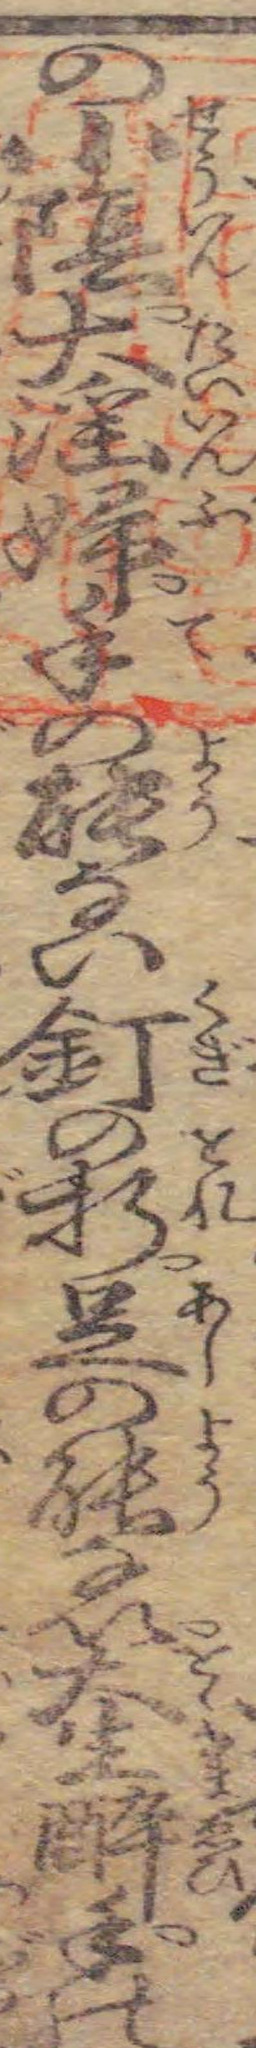の小陰。大淫婦。手の能ない釘の折。足の能ない。大生酔。手の
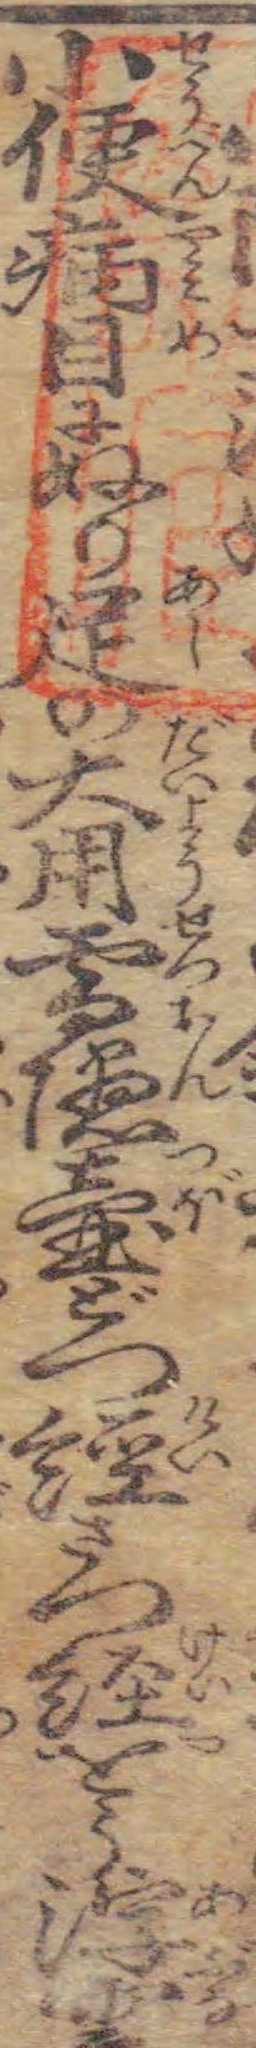小便病目にぬり足の大用雪隠壷どつ経さつ経。をう浮雲。
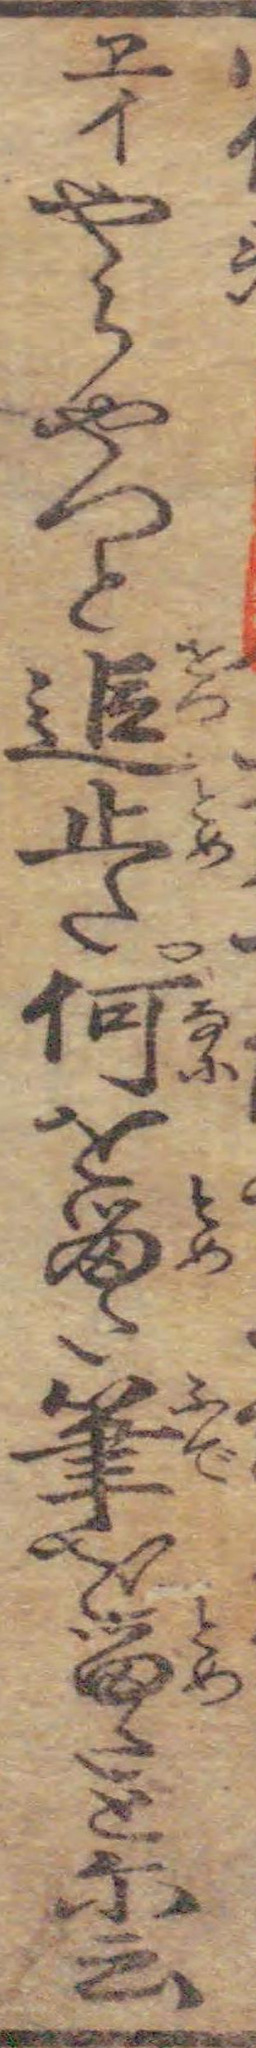ヱイやらやつと追止た。何を留た筆を留たと尓云

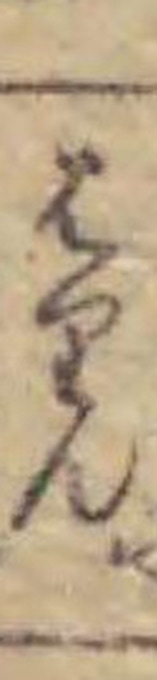はりん
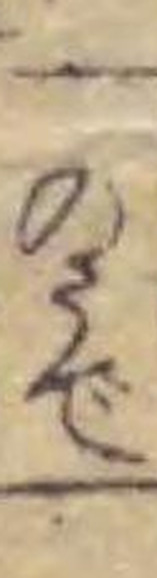のうで

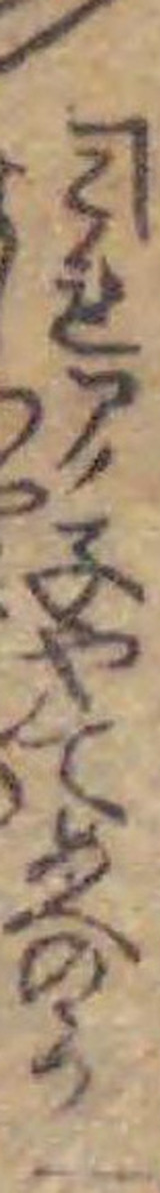〽これアノ子やてめへのう
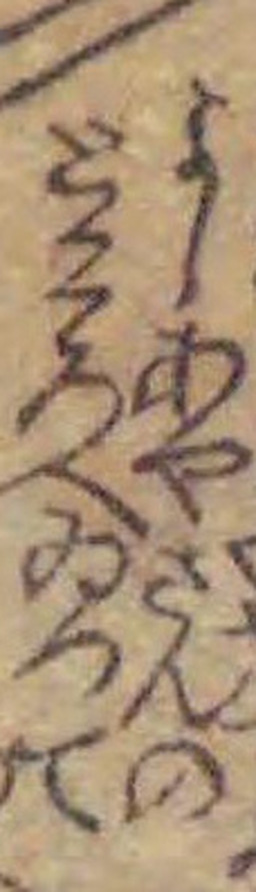ところへゐつて
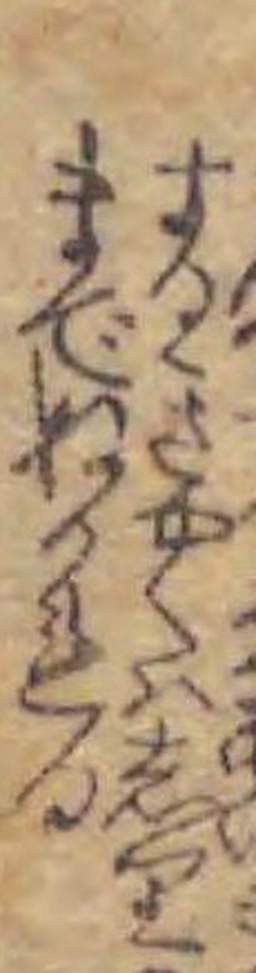までぬかれる
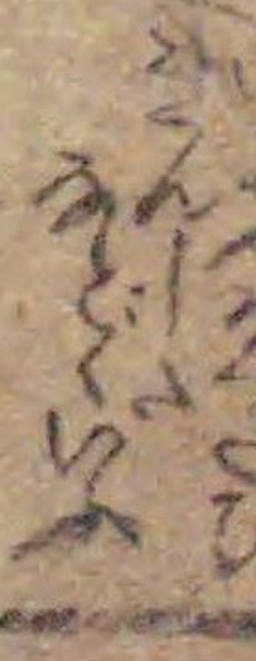などゝいふ
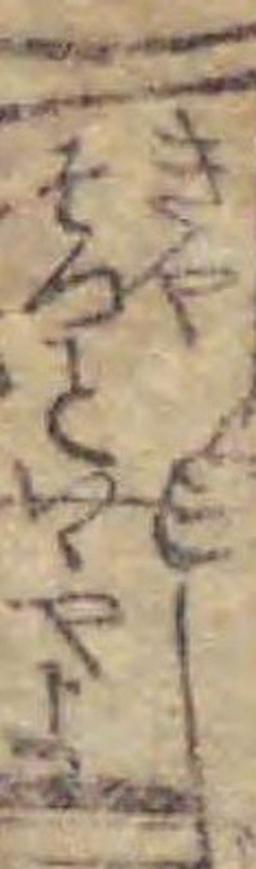そつといゝやよ
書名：十四傾城腹之内 : 3巻
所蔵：国立国会図書館 National Diet Library, JAPAN
